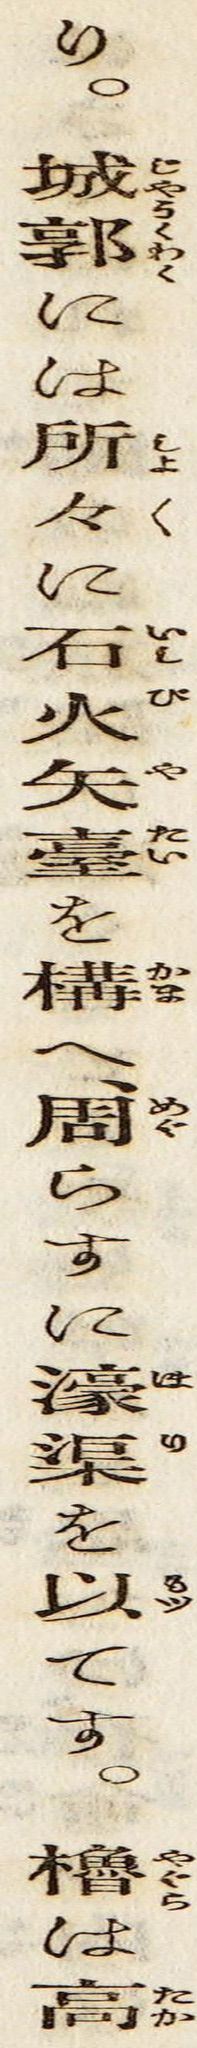り。城郭には所々に石火矢台を構へ、周らすに濠渠を以てす。櫓は高
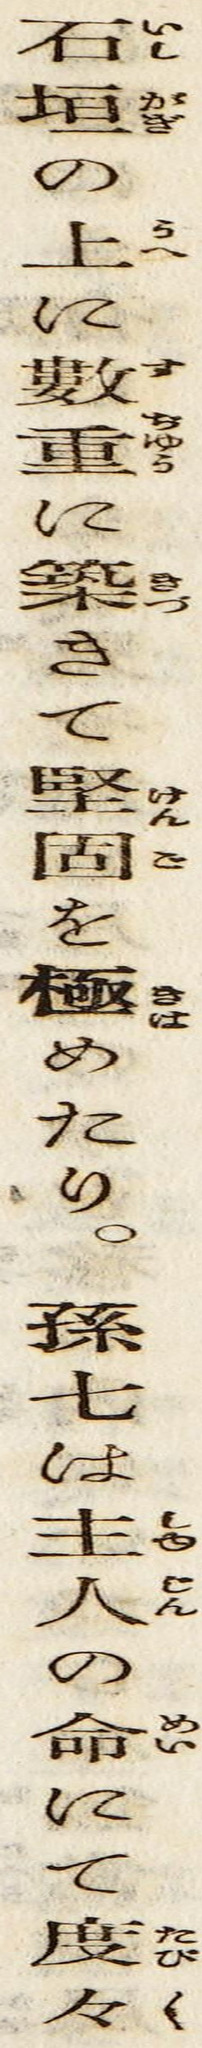石垣の上に数重に築きて堅固を極めたり。孫七は主人の命にて度々
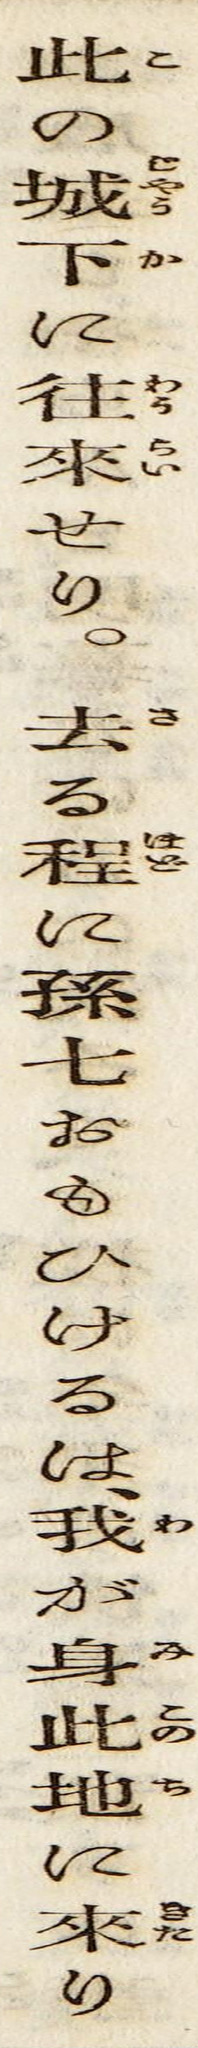此の城下に往来せり。去る程に孫七おもひけるは、我が身此地に来り
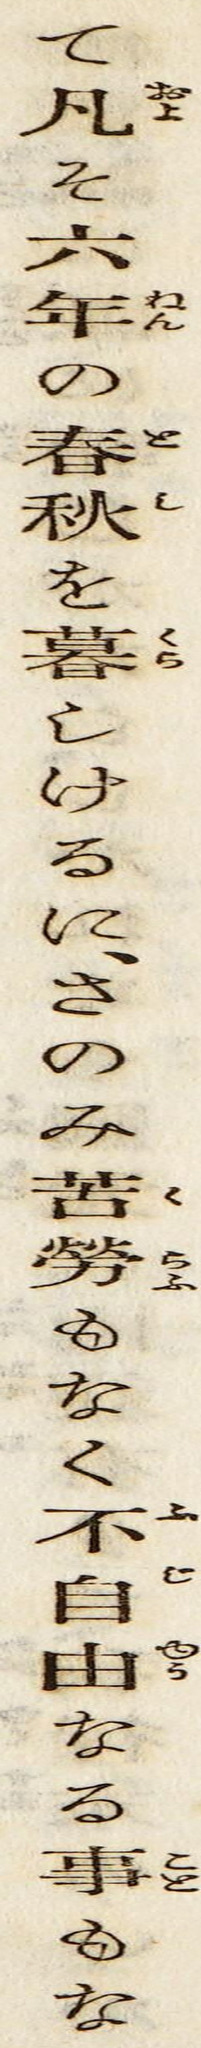て凡そ六年の春秋を暮しけるに、さのみ苦労もなく不自由なる事もな
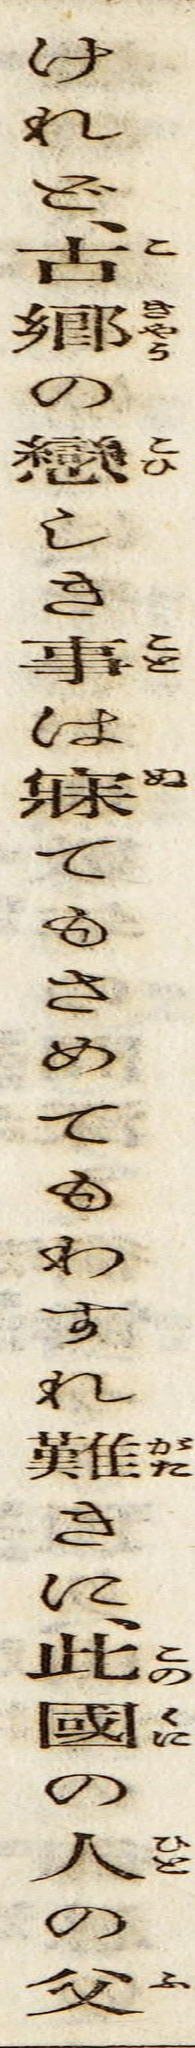けれど、古郷の恋しき事は寐ぬてもさめてもわすれ難きに、此国の人の父
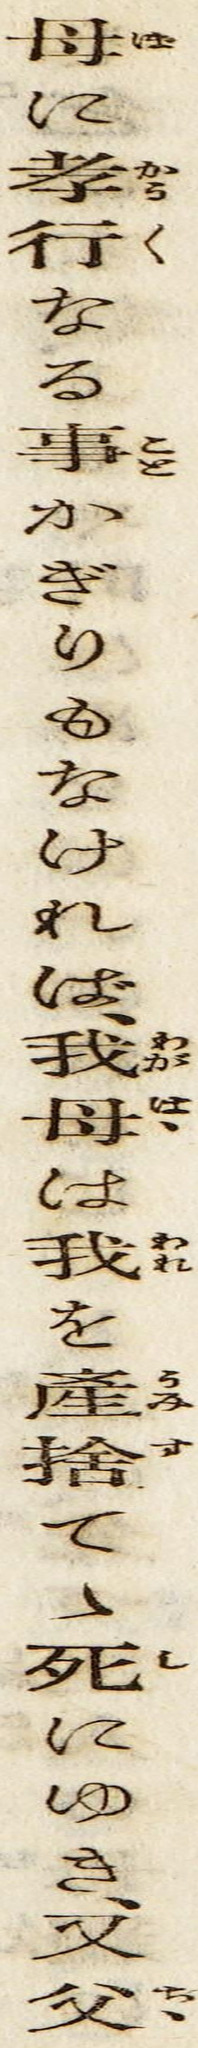母に孝行なる事かぎりもなければ、我母は我を産捨てゝ死にゆき、又父
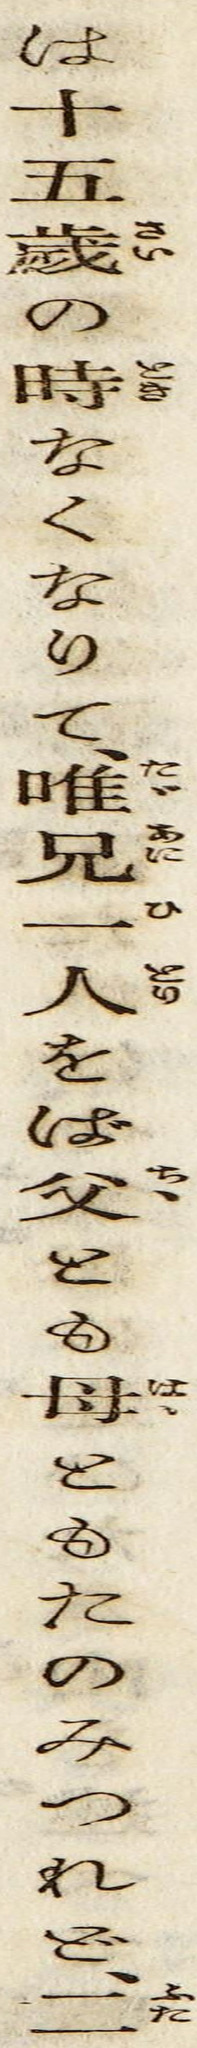は十五歳の時なくなりて、唯兄一人をば父とも母ともたのみつれど、二

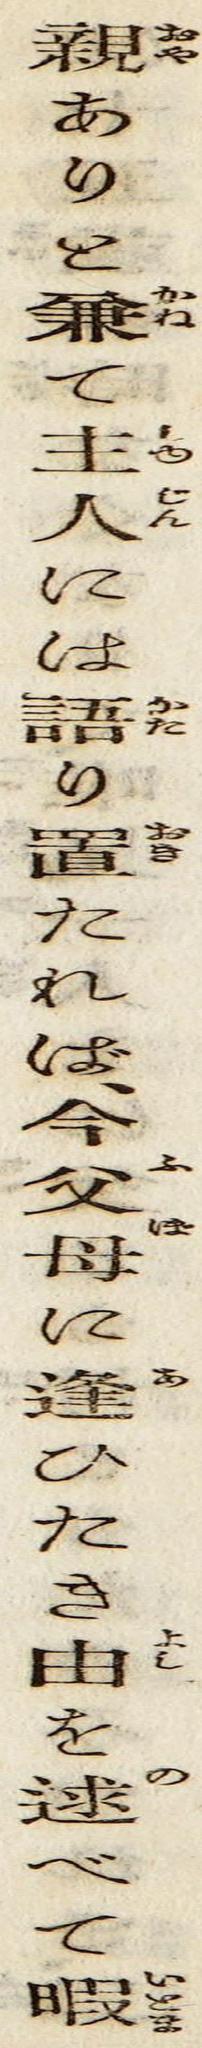親ありと兼て主人には語り置たれば、今父母に逢ひたき由を逑べて暇
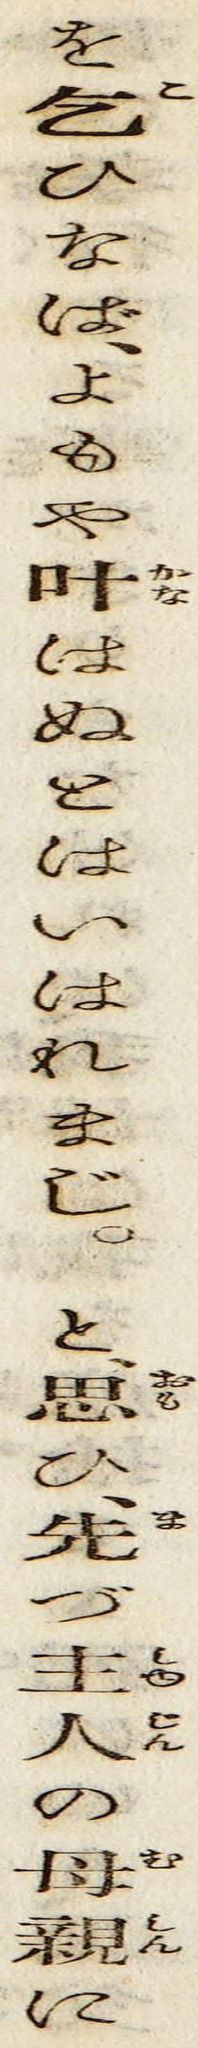を乞ひなば、よもや叶はぬとはいはれまじ。と、思ひ、先づ主人の母親に
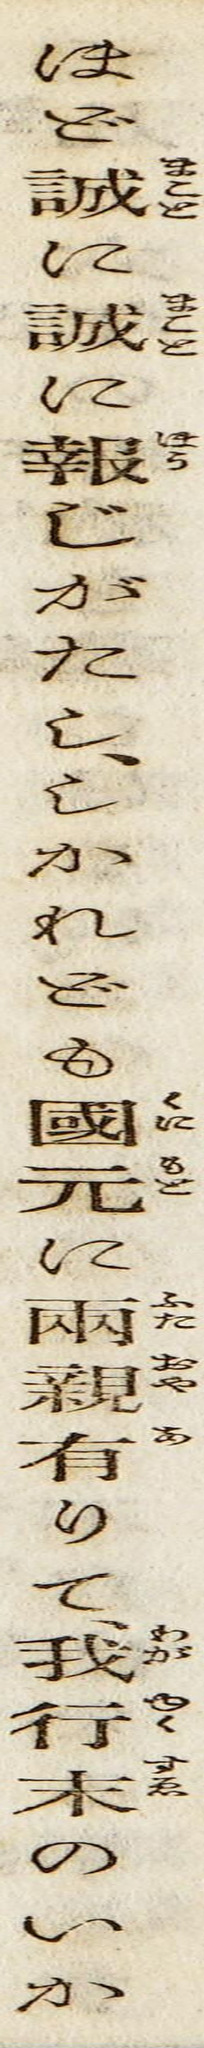ほど誠に誠に報じがたし、しかれども国元に両親有りて、我行末のいか
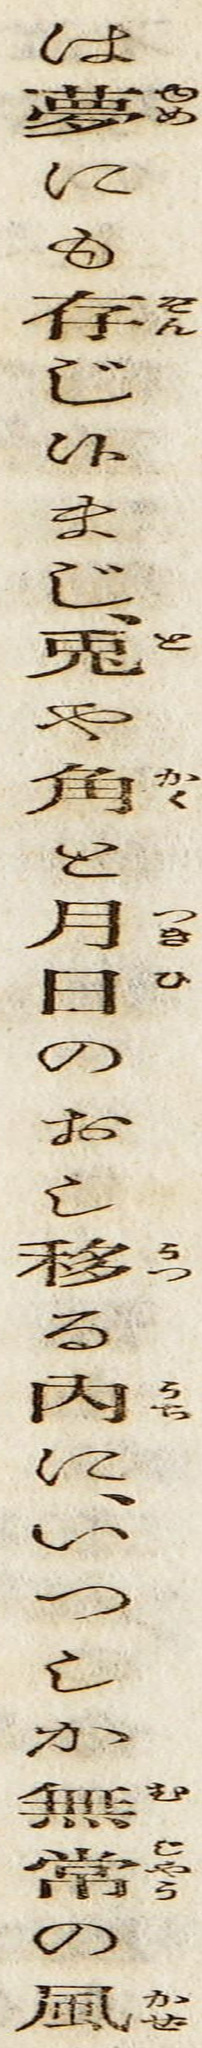は夢にも存じ候まじ、兎や角と月日のおし移る内に、いつしか無常の風
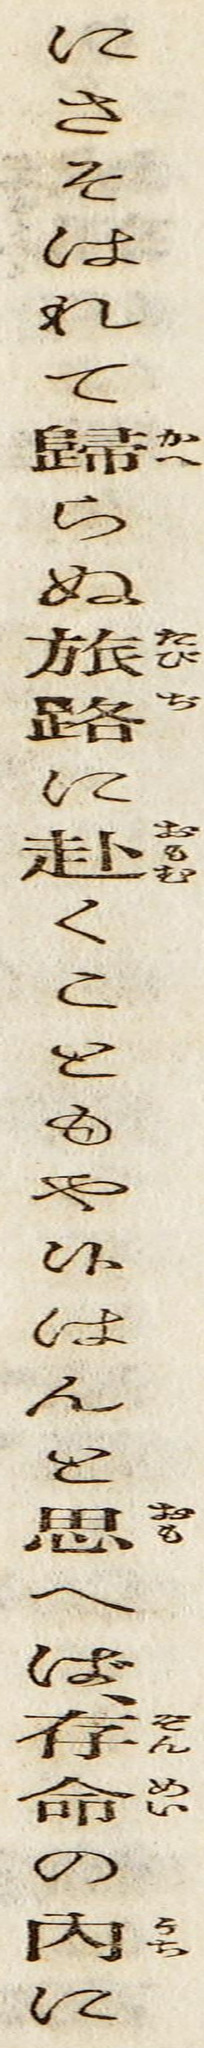にさそはれて帰らぬ旅路に赴くこともや候はんと思へば、存命の内に
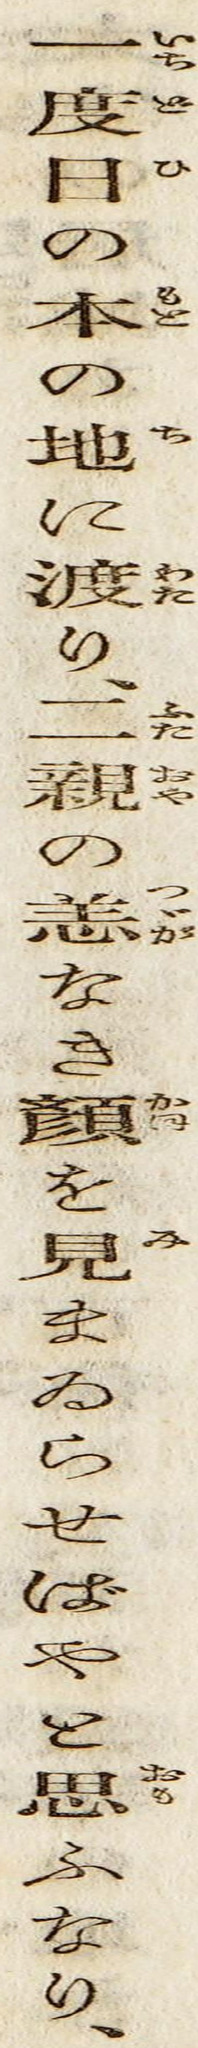一度日の本の地に渡り、二親の恙なき顔を見まゐらせばやと思ふなり、
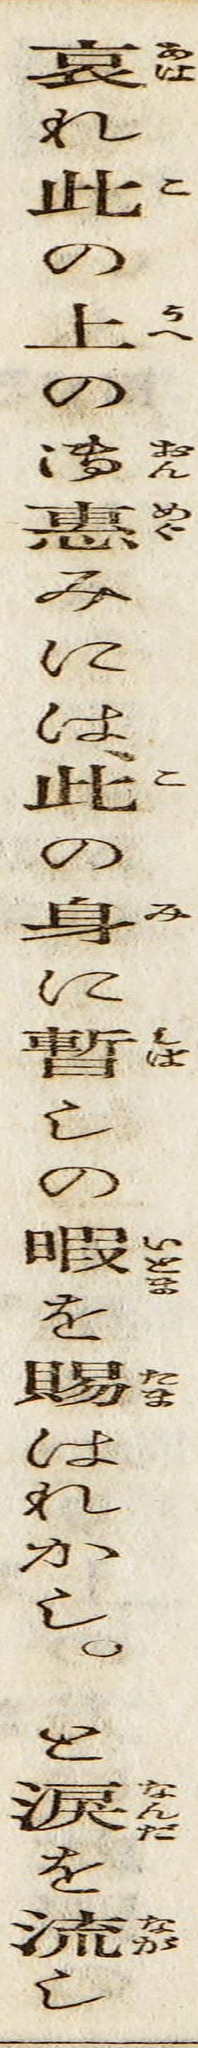哀れ此の上の御恵みには、此の身に暫しの暇を賜はれかし。と涙を流し
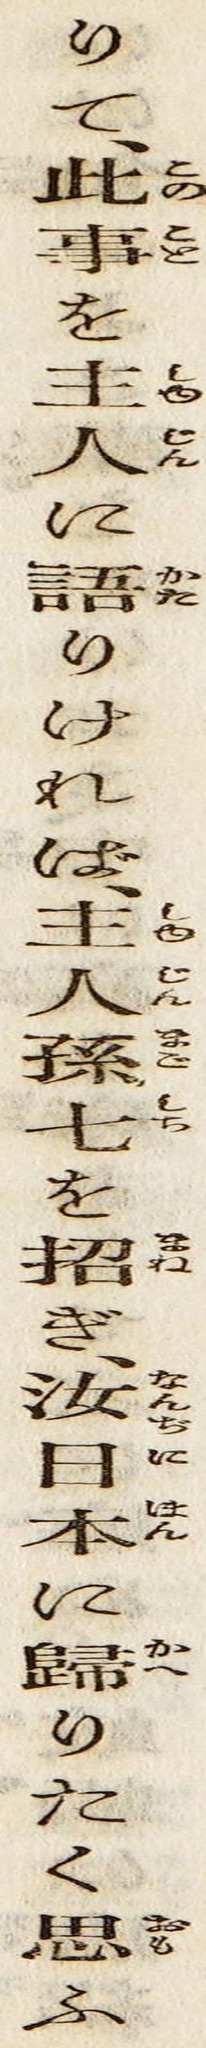りて、此事を主人に語りければ、主人孫七を招ぎ、汝日本に帰りたく思ふ
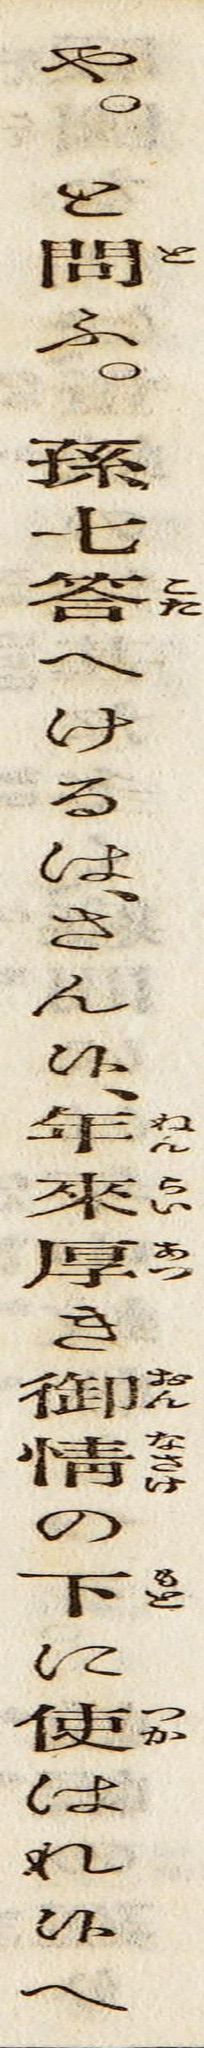や。と問ふ。孫七答へけるは、さん候、年来厚き御情の下に使はれ候へ
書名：日本漂流譚
